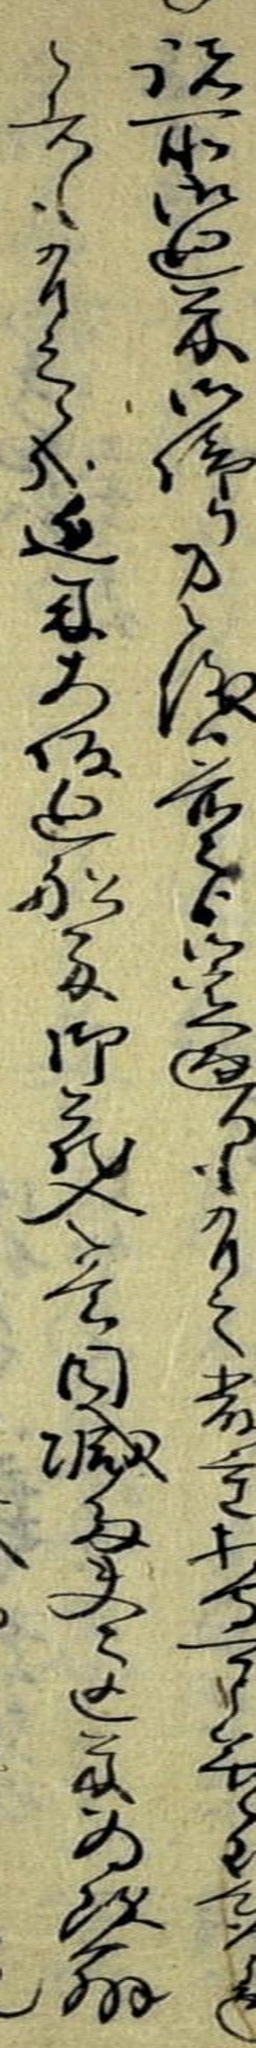之者も有之候哉近来大坂廻船米御蔵入之節目減多夫々込米為致弁
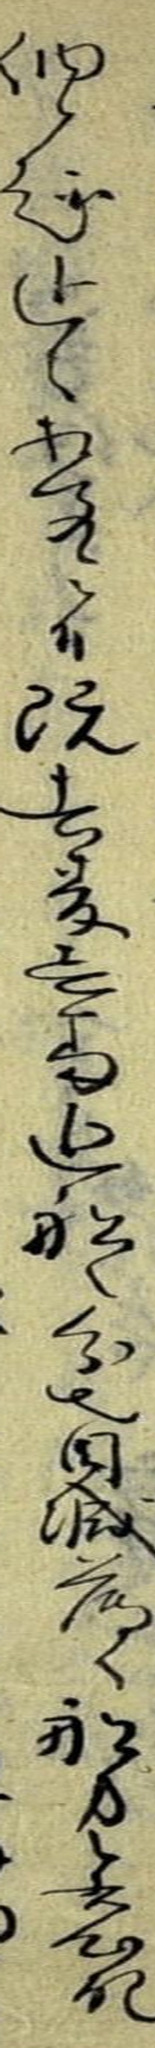納之趣追々相聞候に付既去夏壱番廻船之分は目減薄く船方之者心配
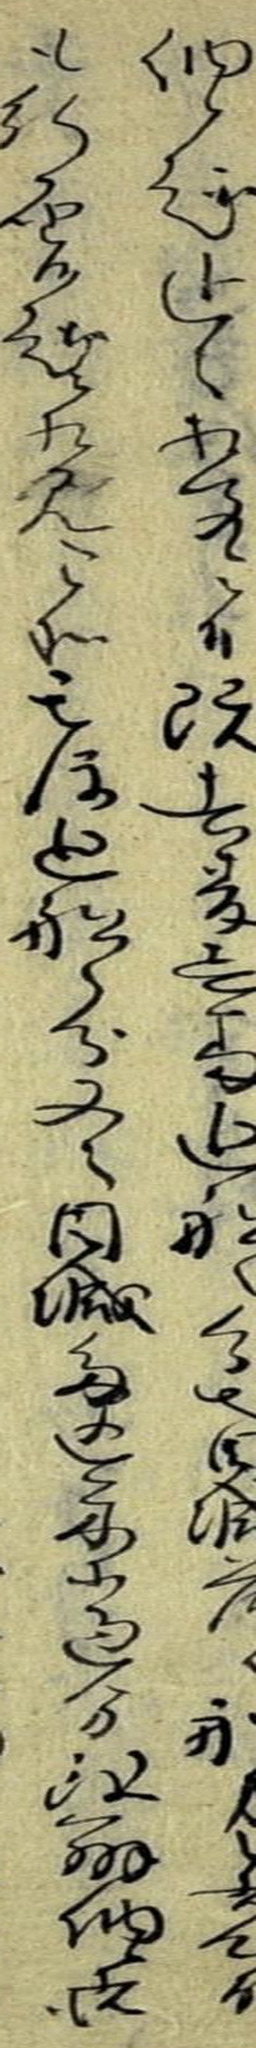も行届候趣に相見へ候処其後廻船之分又々目減多込米等過分致弁納候者も
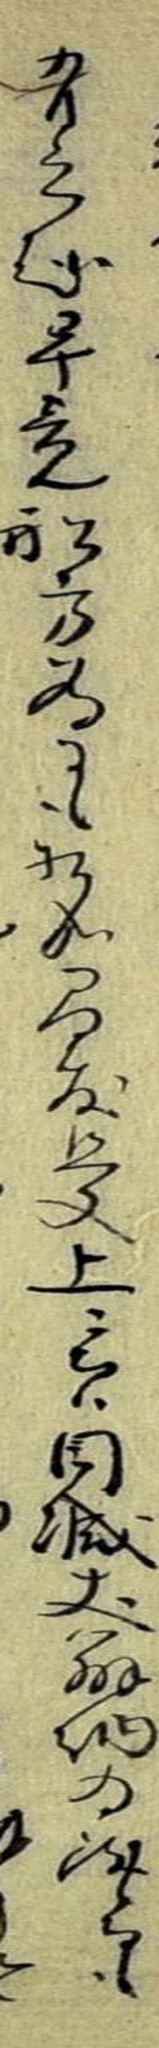有之候趣畢竟船方為にも相成間敷且又上に而は目減丈弁納為済候而も
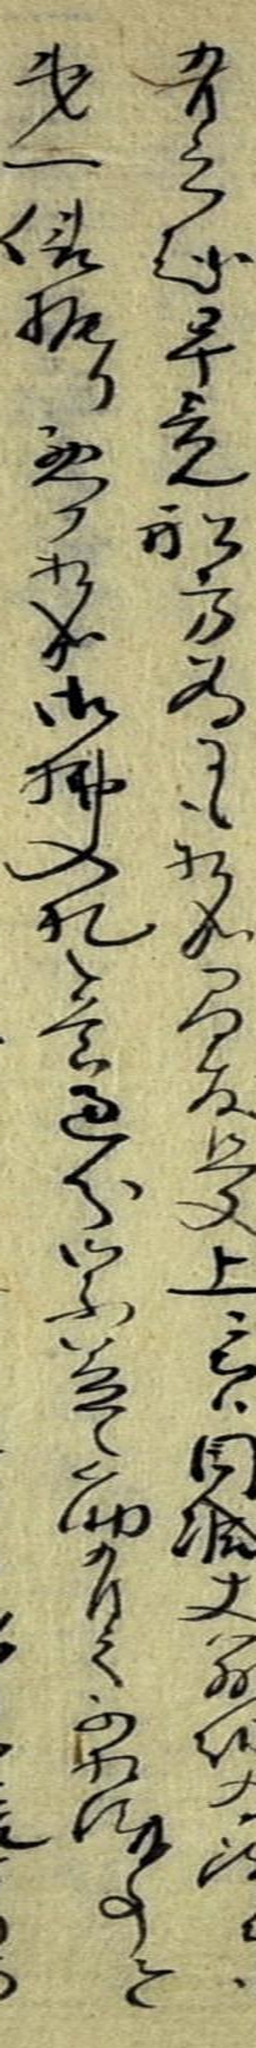第一俵振り悪く相成御払入札之節過分御不益之筋有之可相糺明事に候
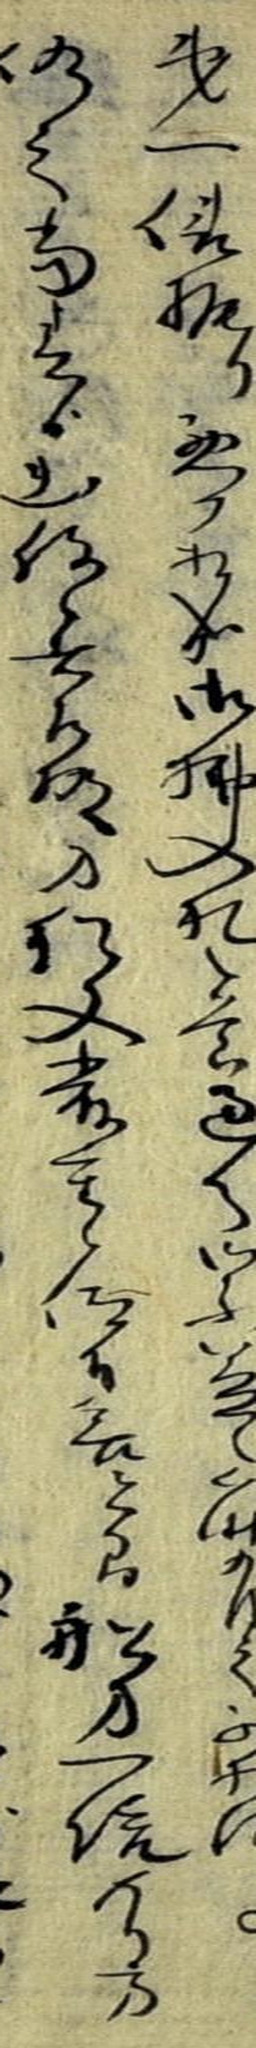仍之当春ゟ出役之者取扱方猶又厳重被仰付候筈に候間船方一統〆り方
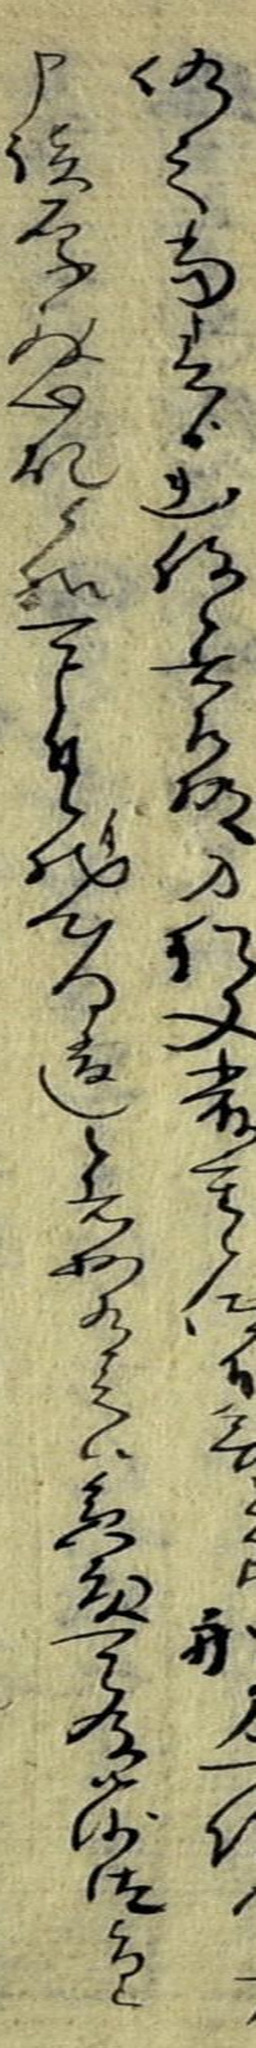申談厚致心配候様可申付候乍然心得違之者於有之は急度可被及御沙汰旨被
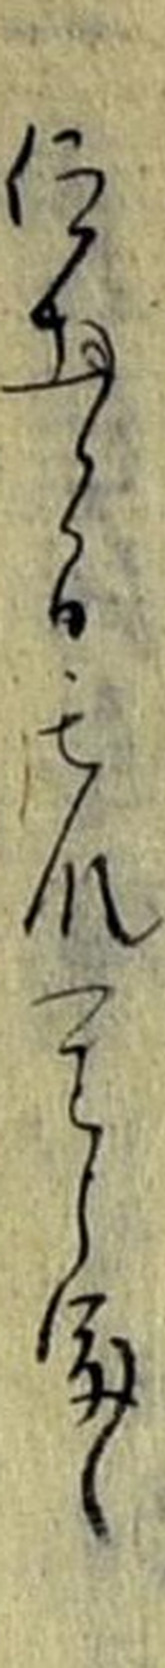仰出候間其段可被申渡候
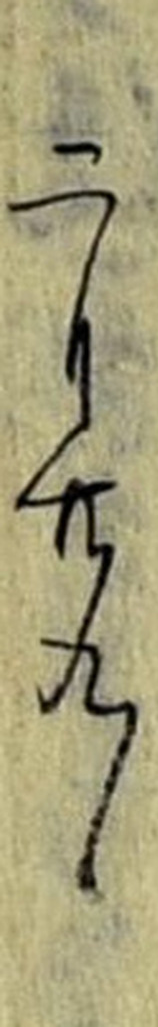二月廿九日

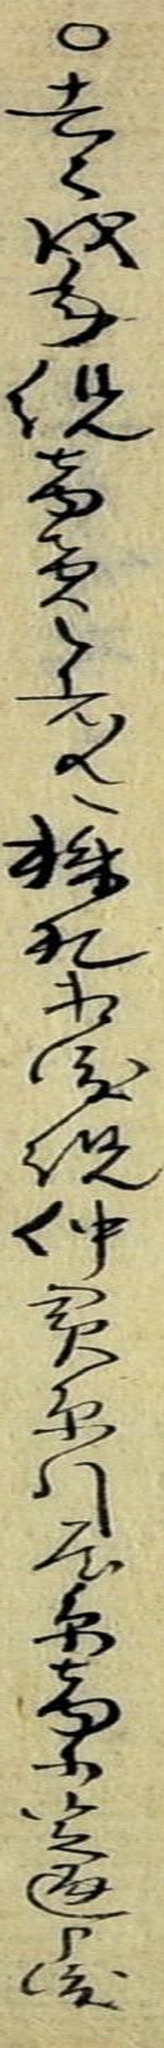○去々戌年繭商売之者共へ株札相渡繭仲買糸引屋糸商等定通申渡
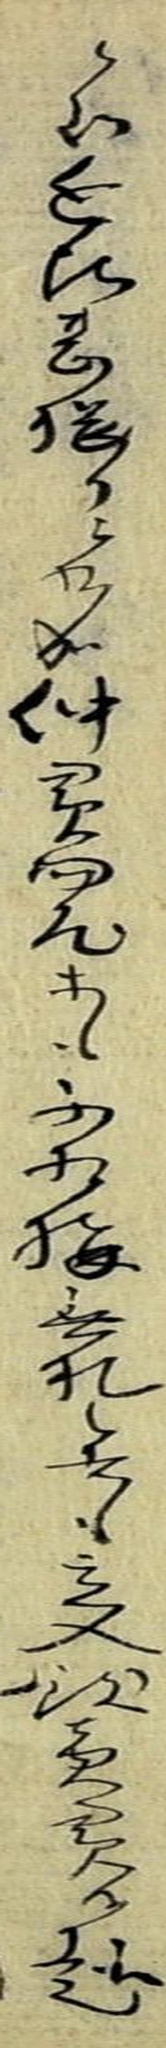候処近頃甚猥りに相成仲買問屋等も不相構無札之者も立入致売買候趣
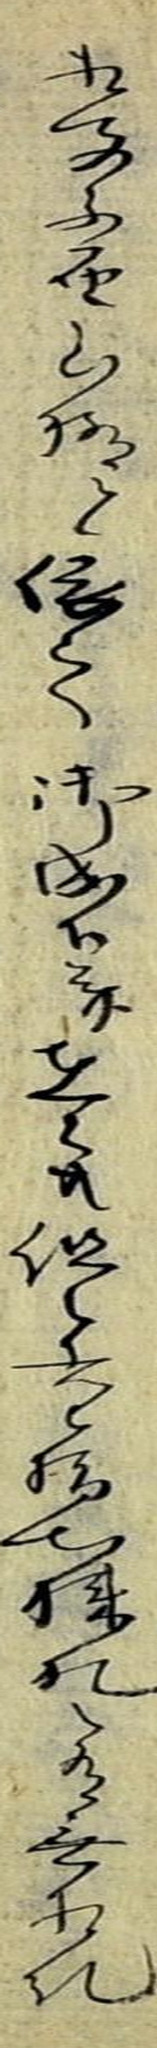相聞不届至極に候依之御城下并在々共組之者被指出株札之有無相糺
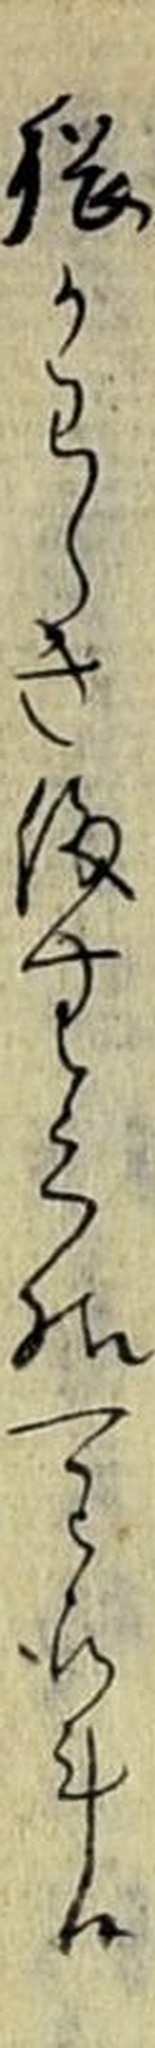猥りわらき儀無之様可被取斗候
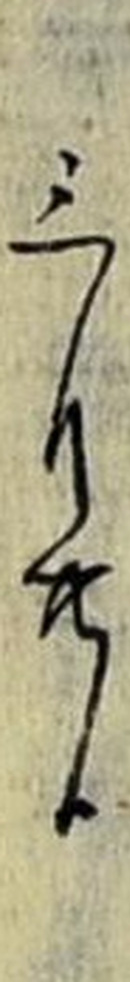三月廿日
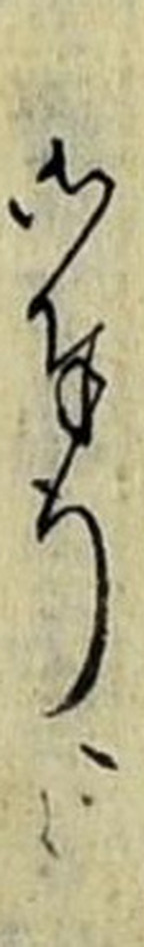御奉行
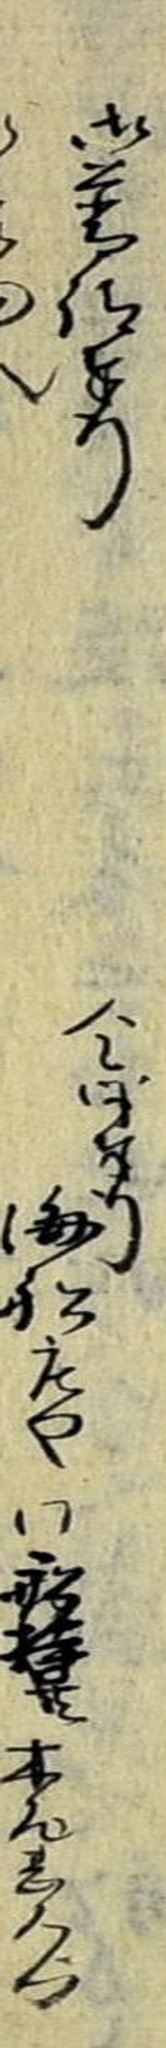御普請奉行金津奉行
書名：命令之部 四
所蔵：福井県文書館 Fukui Prefectural Archives
